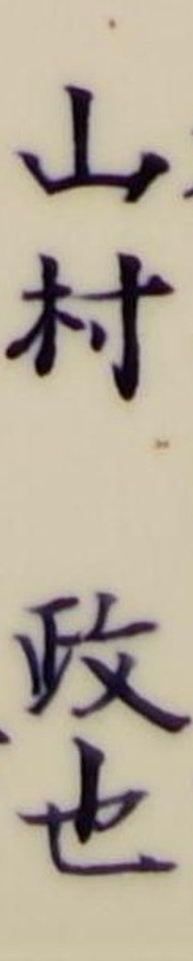山村政也
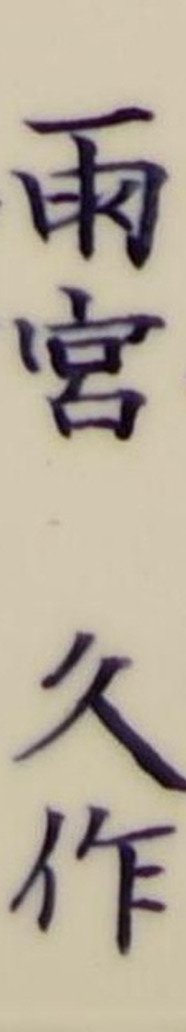雨宮久作
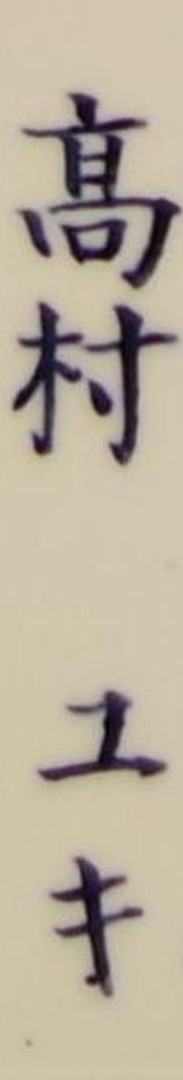高村ユキ
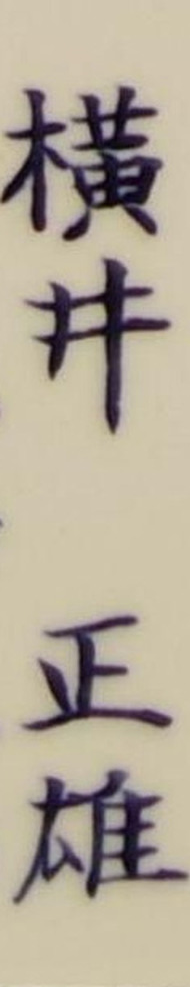横井正雄
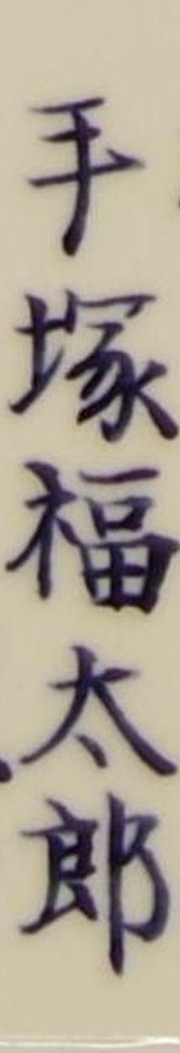手塚福太郎
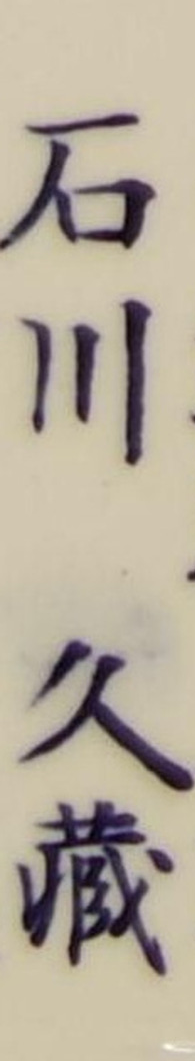石川久蔵
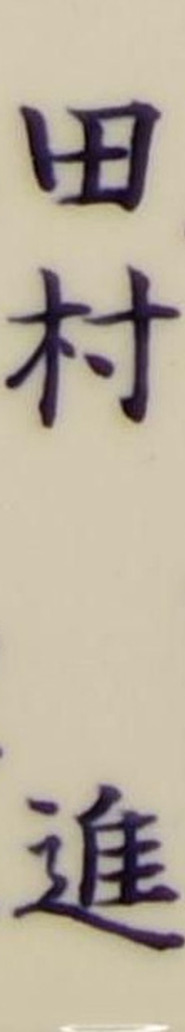田村進
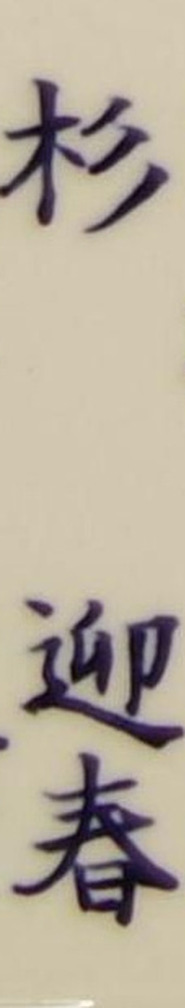杉迎春
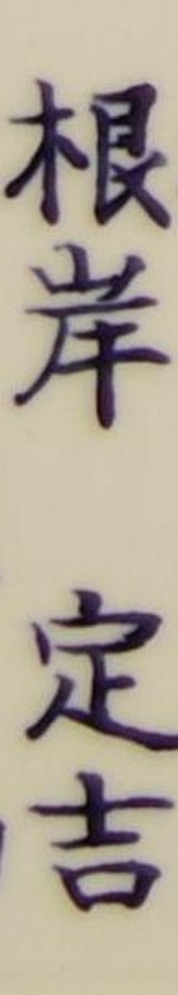根岸定吉
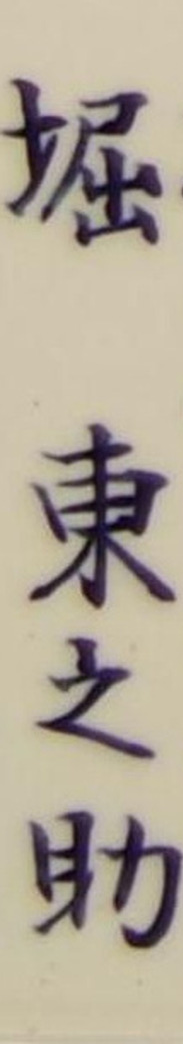堀東之助
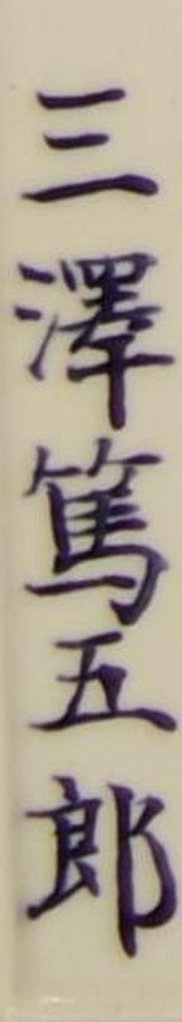三澤篤五郎

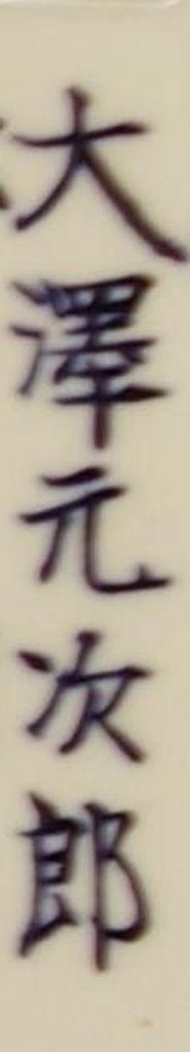大澤元次郎
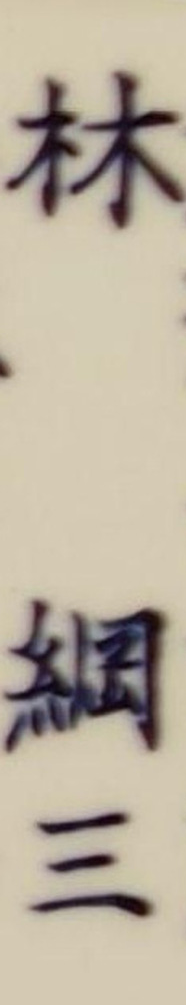林綱三
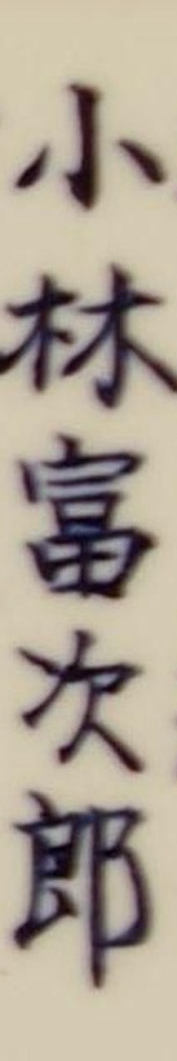小林富次郎
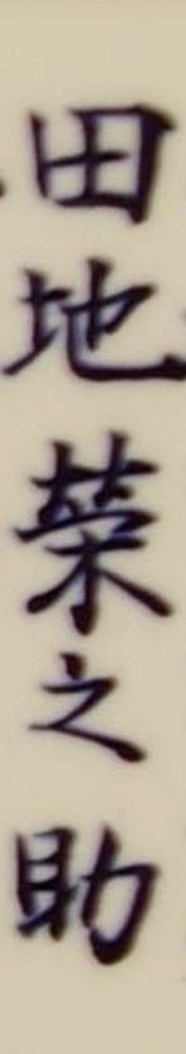田地栄之助
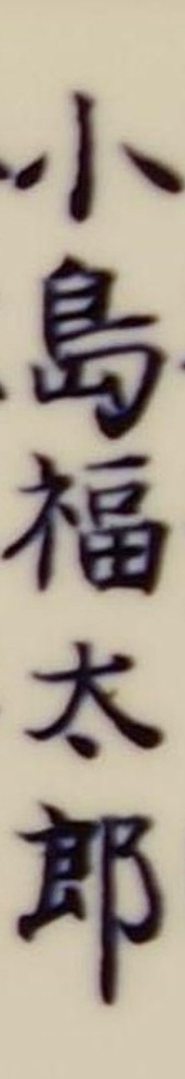小島福太郎
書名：E~L
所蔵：高野山金剛峯寺
